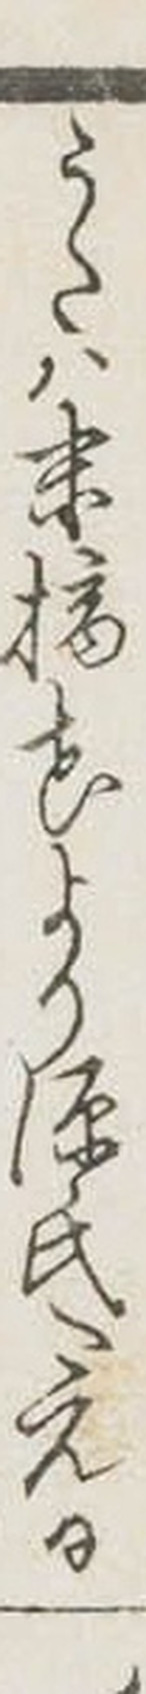うたは末摘花より源氏へ元日
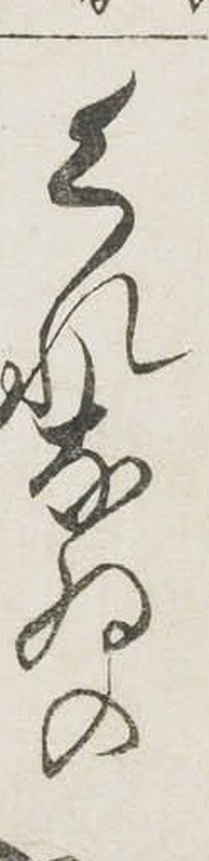くれなゐの
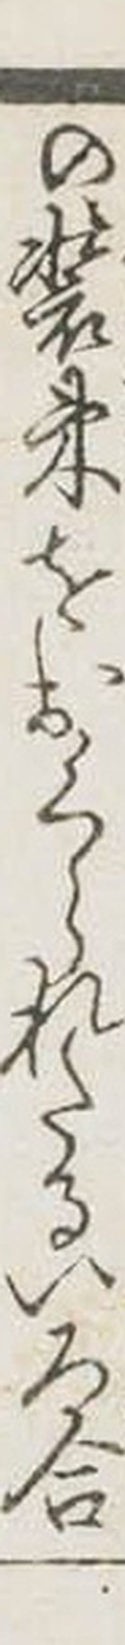の装束をおくられたるいろ合
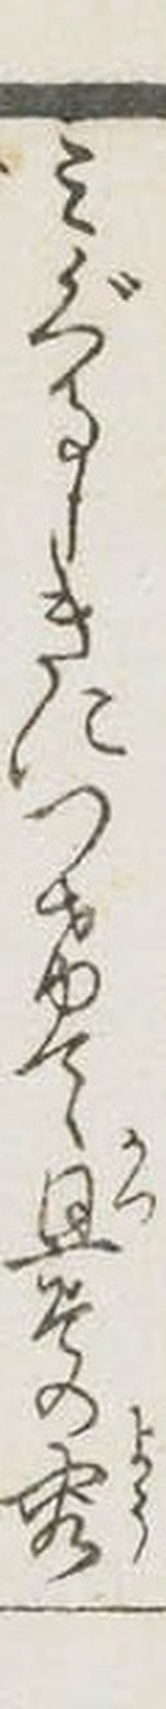みぐるしきにつけて且その容
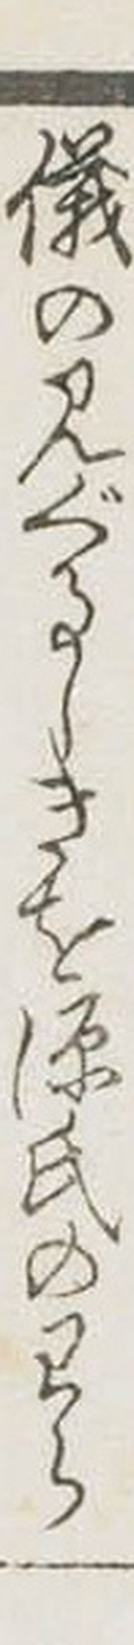儀の見ぐるしきを源氏のわら
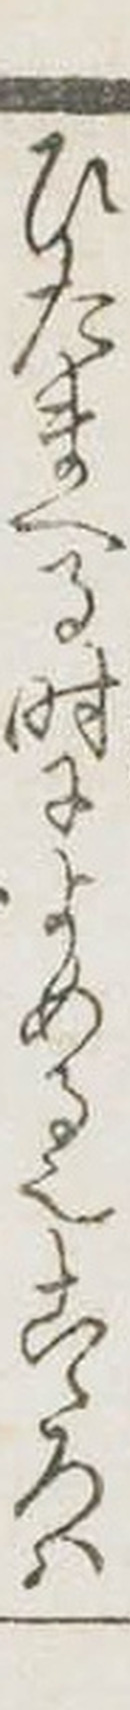ひたまへる時によめる也こゝろは
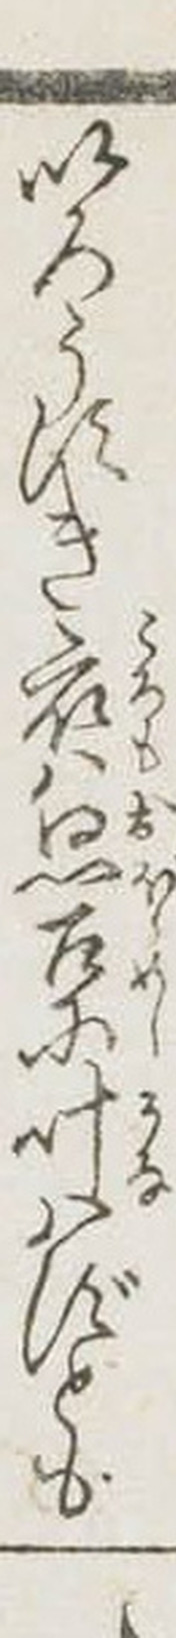いろうすき衣は思召にか叶はずとも
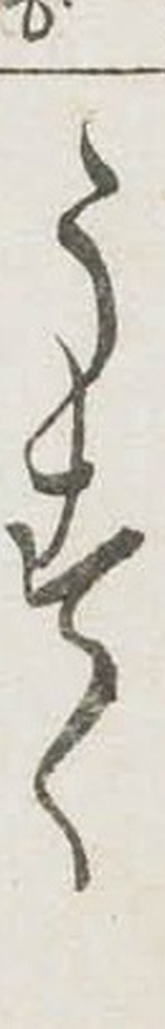うすく
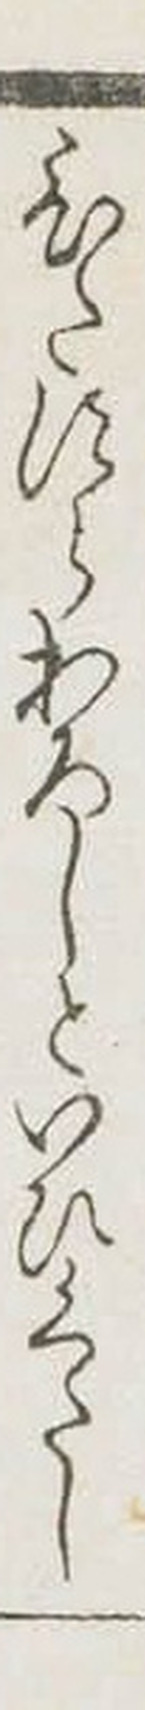ひたすらわろしといひくたし
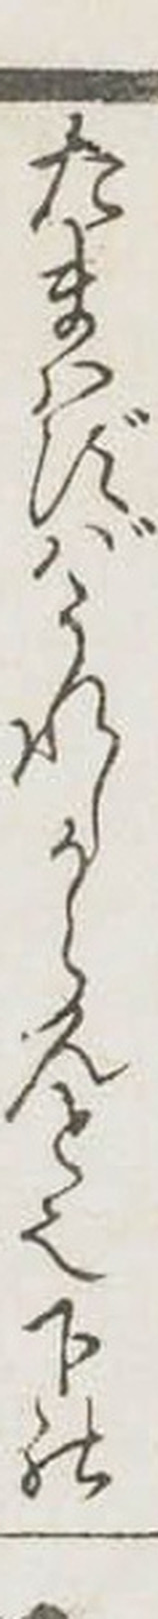たまはずばうれしからんと也下の
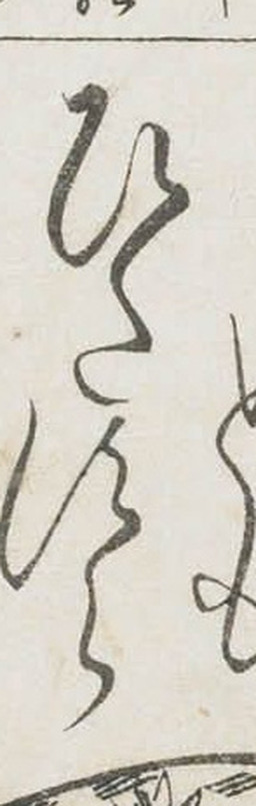ひたすら
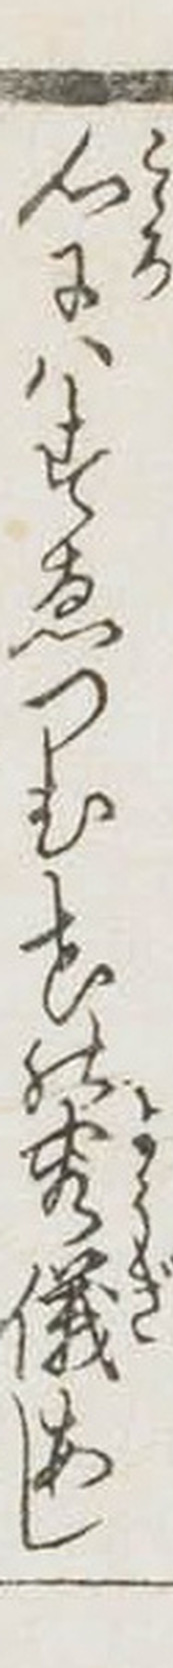心にはすゑつむ花の容儀あし
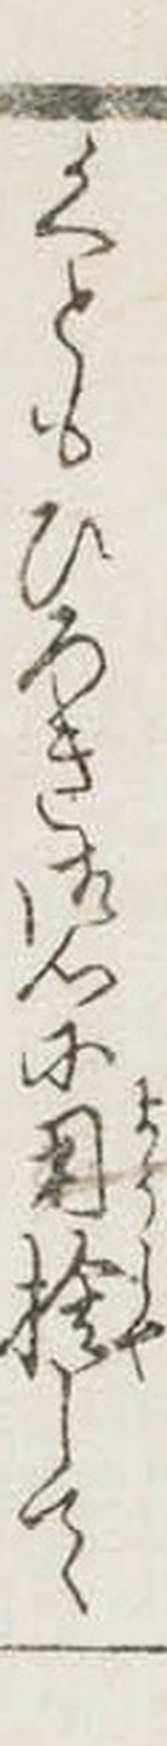くともひろき御心に用捨して
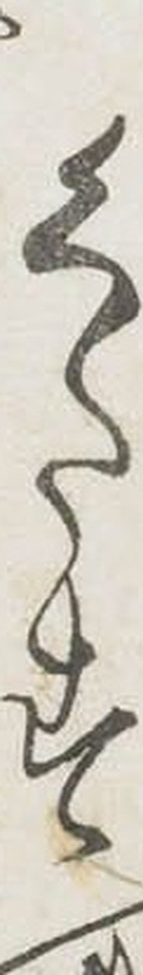くたす
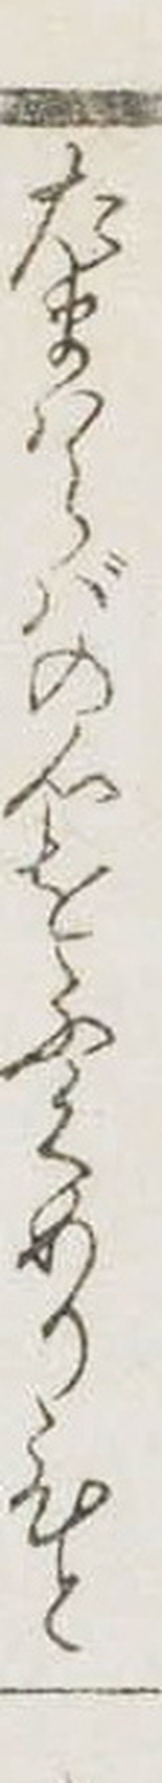たまはらばの心をふくめりひと
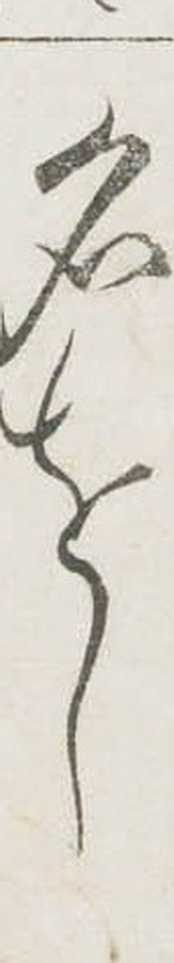名をし
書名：源氏百人一首
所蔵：東京学芸大学教育コンテンツアーカイブ
